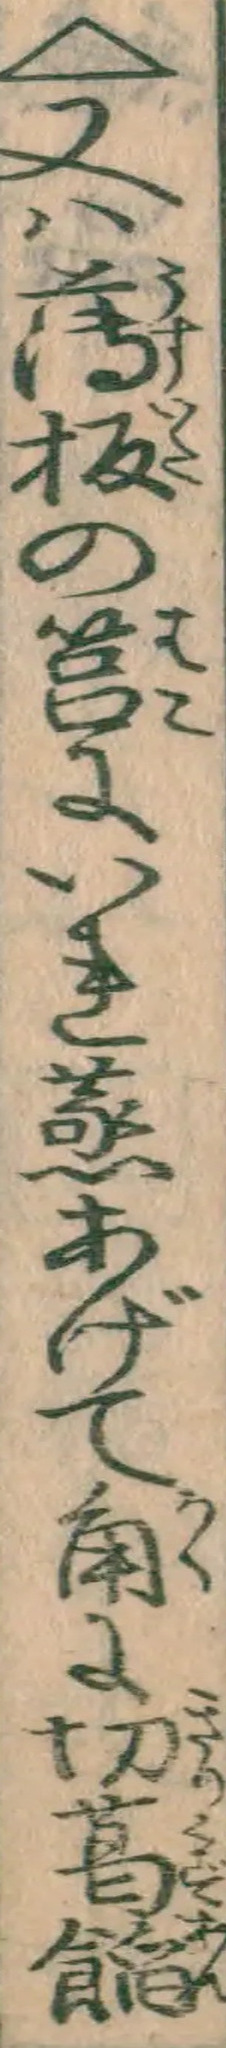△又は薄板の筥にいれ蒸あげて角に切葛餡
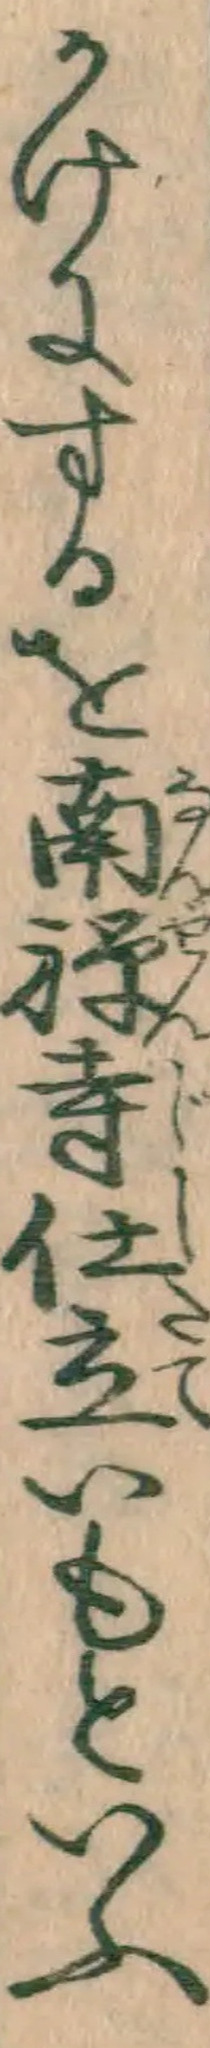かけにするを南禅寺仕立いもといふ
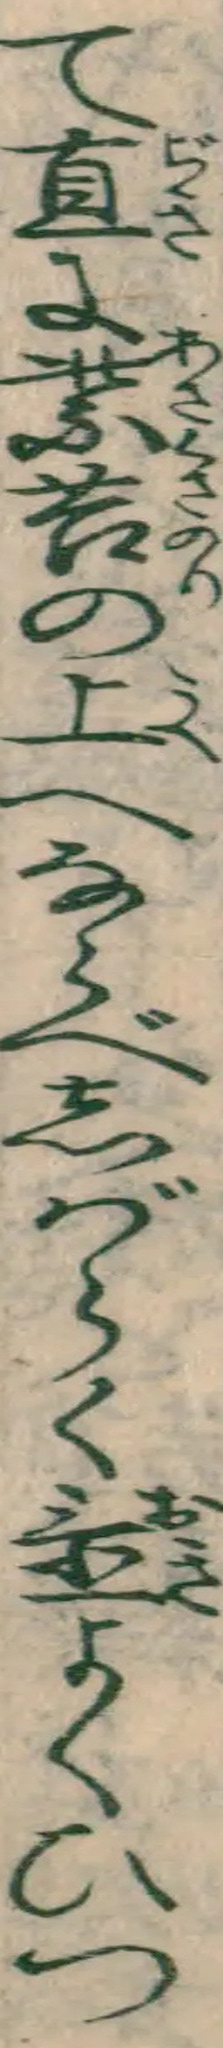て直に紫苔の上へならべしばらく置よくひつ
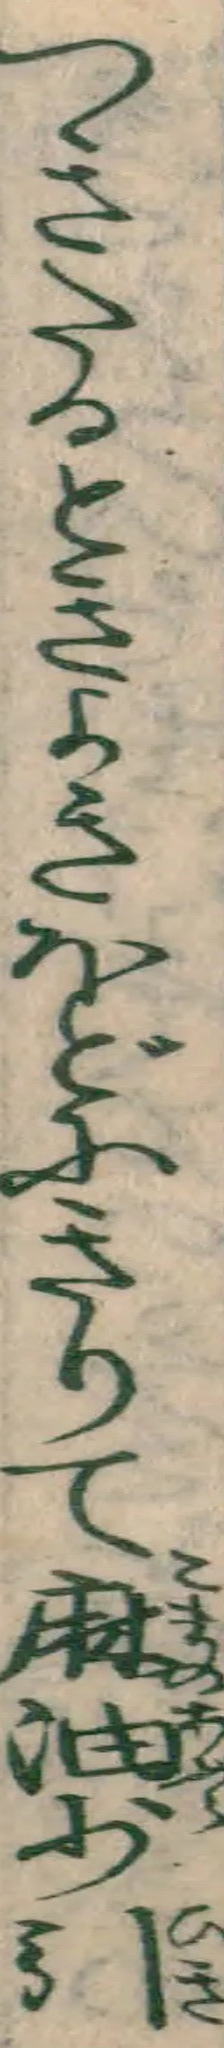つきたるときよきほどにきりて麻油少引
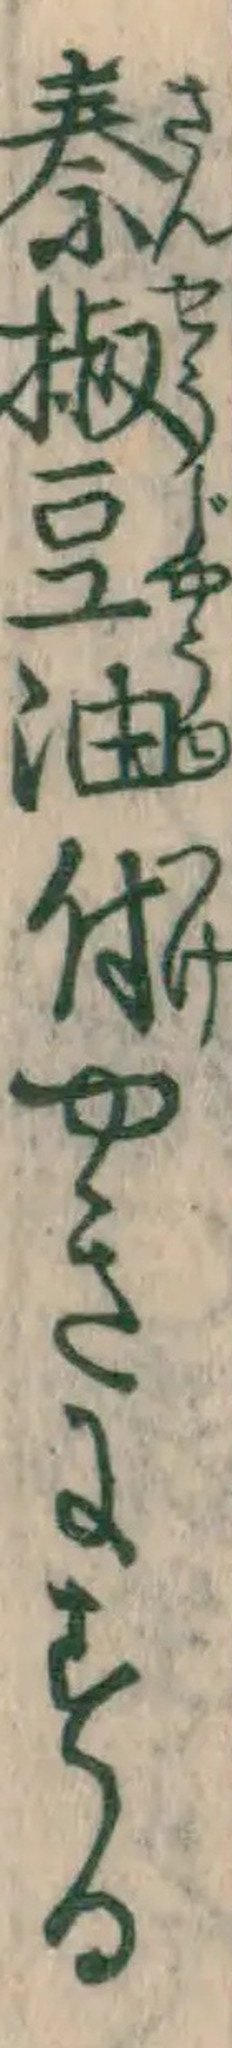山椒豆油付やきにする
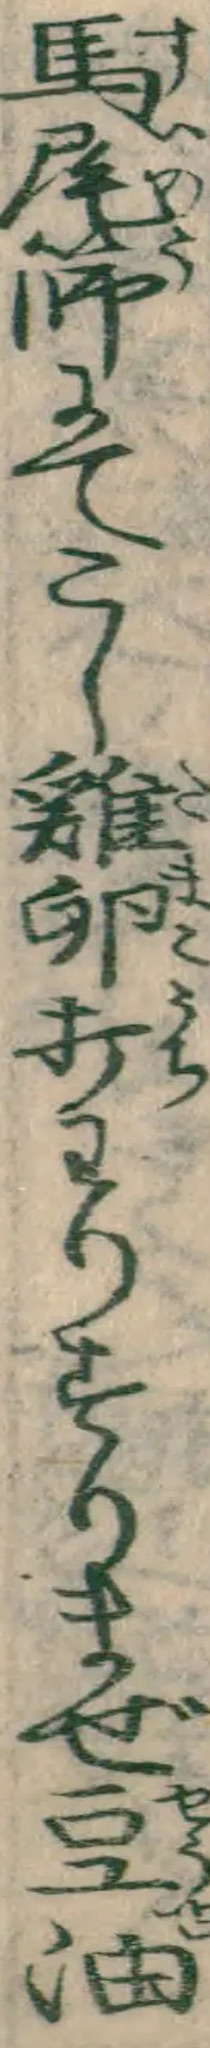馬尾篩にてこし鶏卵打わりすりまぜ豆油
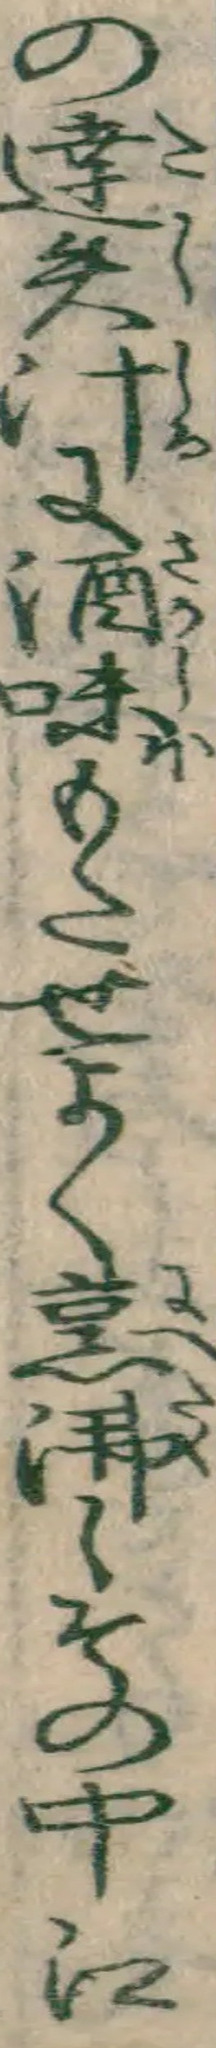の達矢汁に酒味もたせよく烹沸しその中え
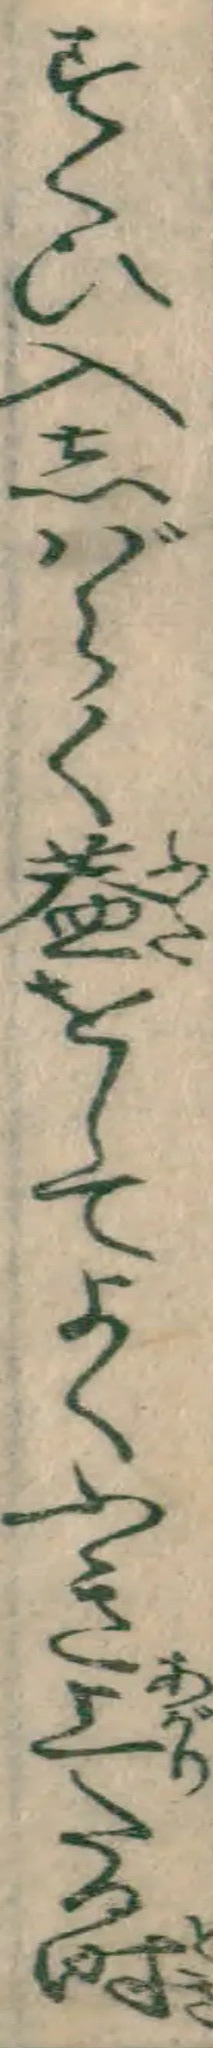すくひ入しばらく蓋をしてよくふき上たる時
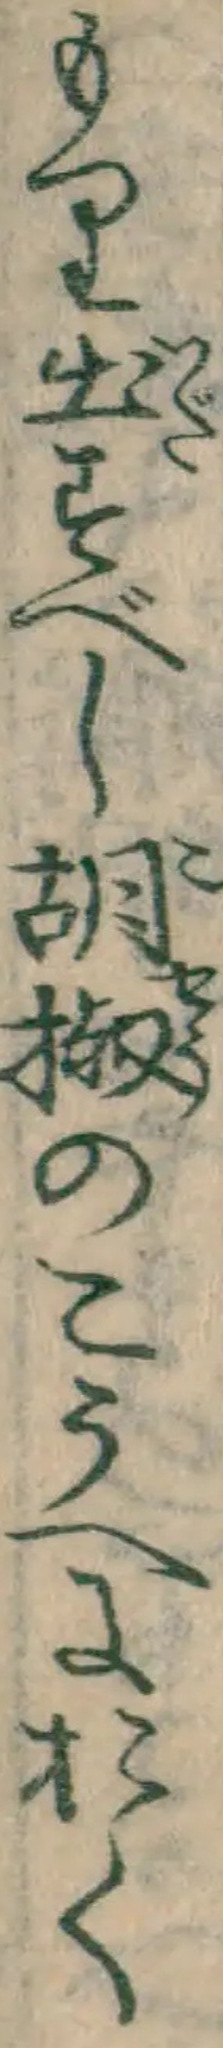もり出すべし胡椒のこうへにおく

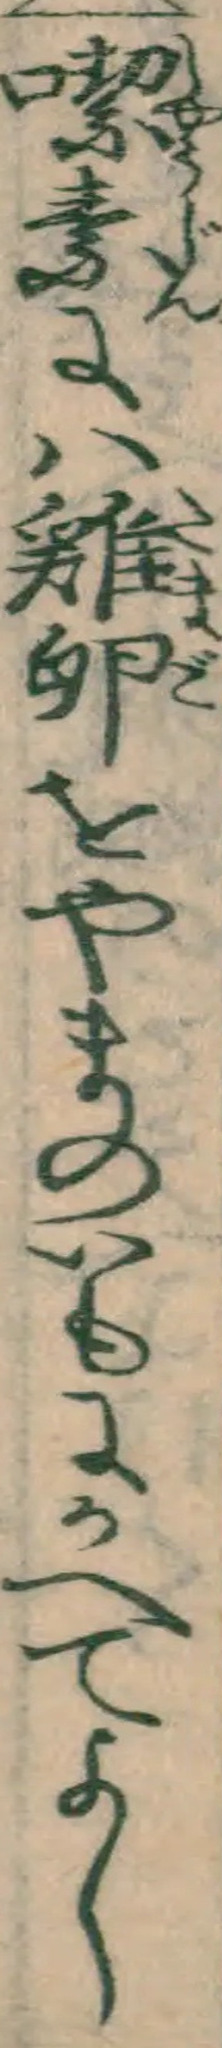△噄素には鶏卵をやまのいもにかへてよし
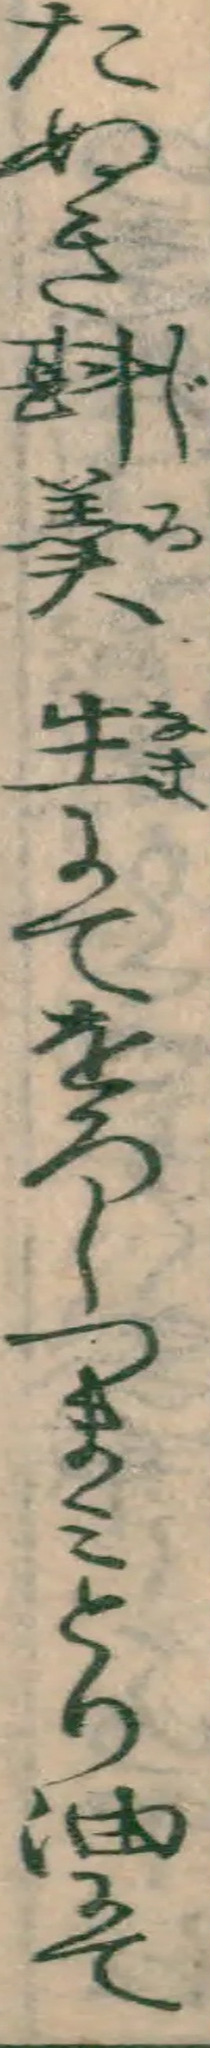[百十八]たぬき斟羹生にてをろしつまみとり油にて
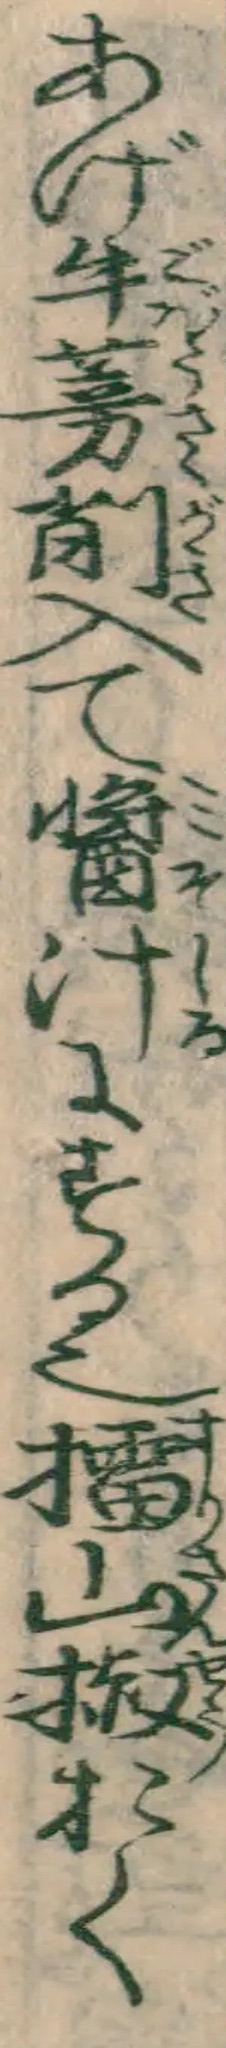あげ牛蒡削入て醤汁にする也擂山椒おく
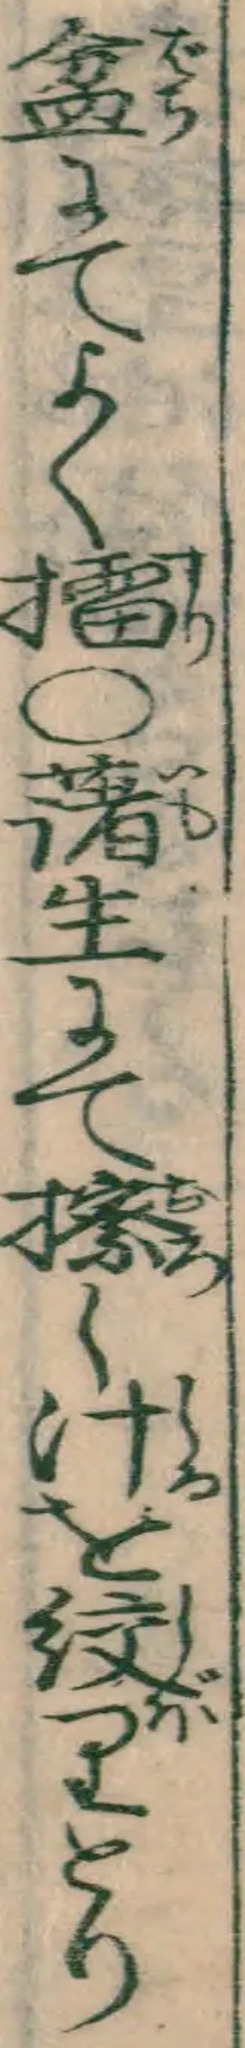盆にてよく擂○藷生にて擦し汁を絞りとり
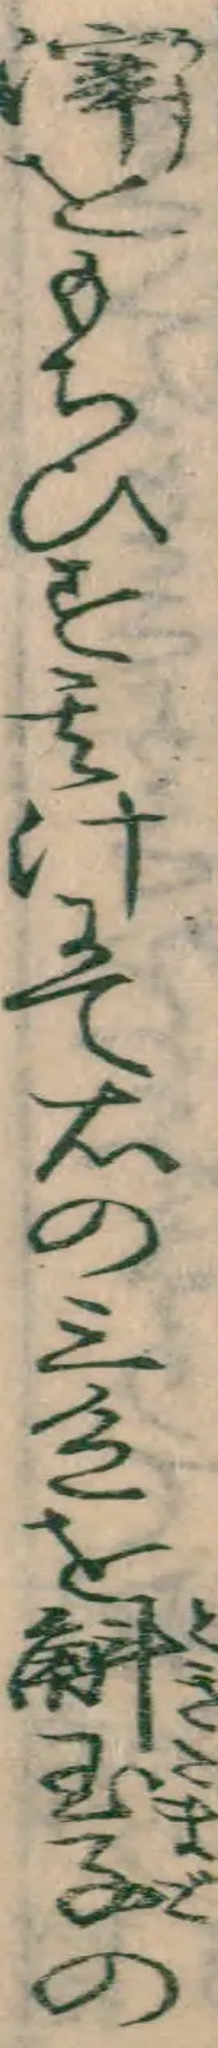滓をもちひす其汁にて右の三色を斛玉子の
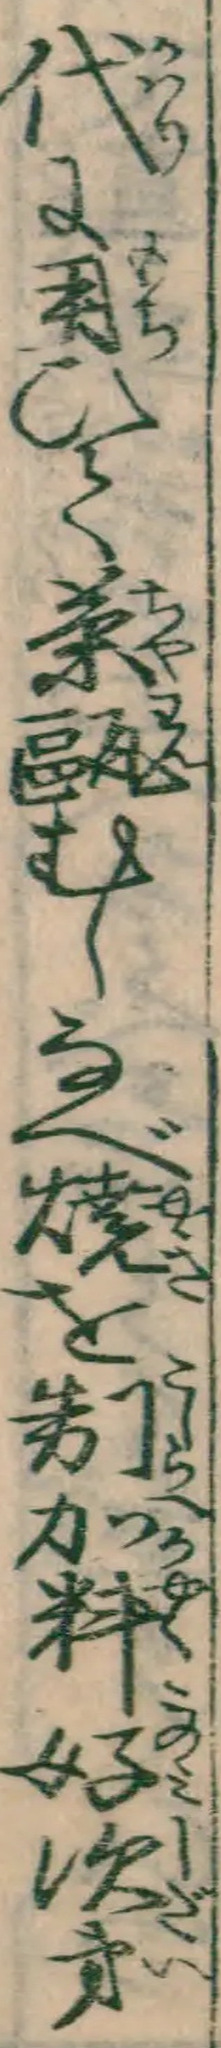代に用ひて茶甌むしなべ焼を制加料好次第
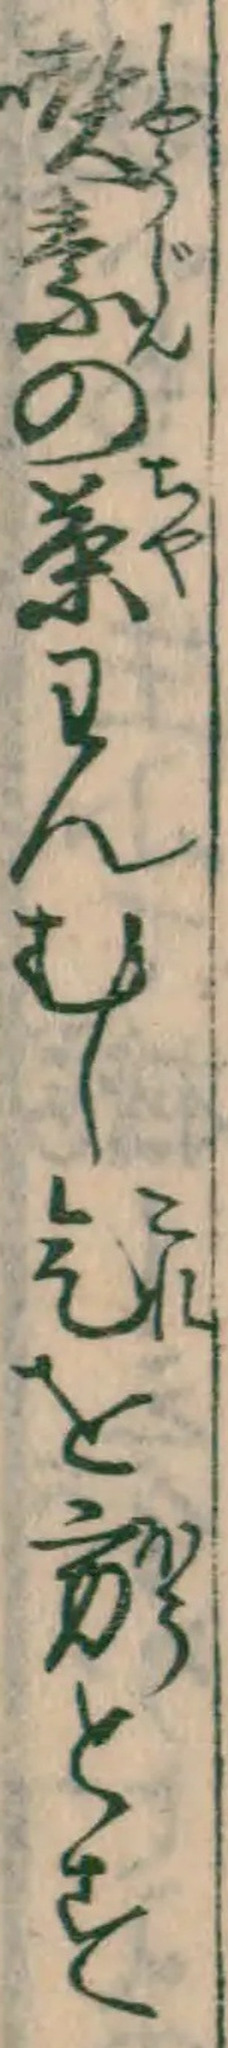噄素の茶わんむし是を方とす
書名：甘藷百珍
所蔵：国立国会図書館 National Diet Library, JAPAN
